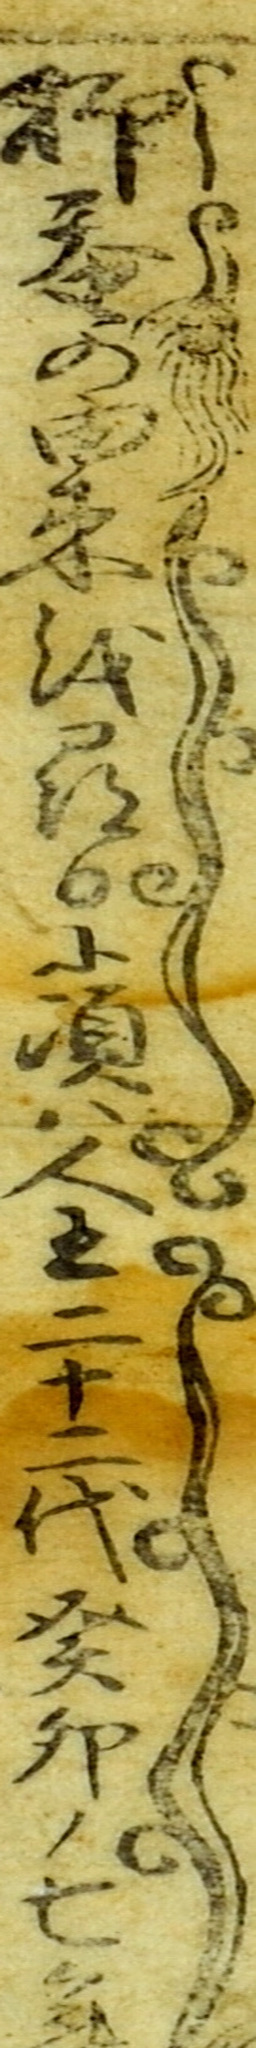抑蚕の由来を尋るに頃は人王二十二代癸卯ノ七年箱当
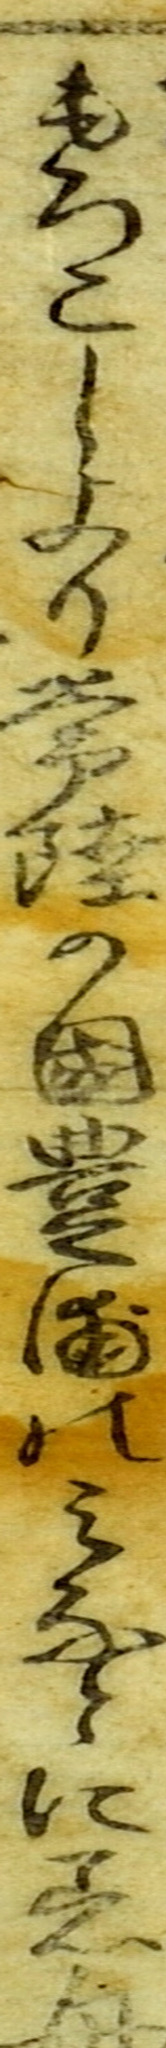もろこしより常陸の国豊浦のみなとに着舟あり
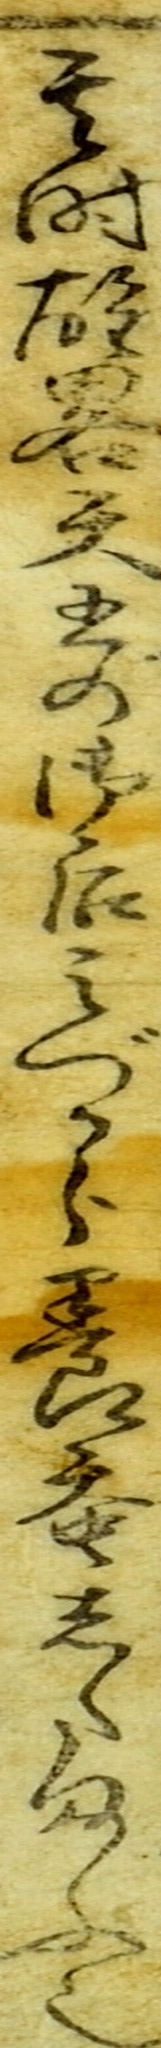其時雄略天王の御后みづから養蚕したまふ也
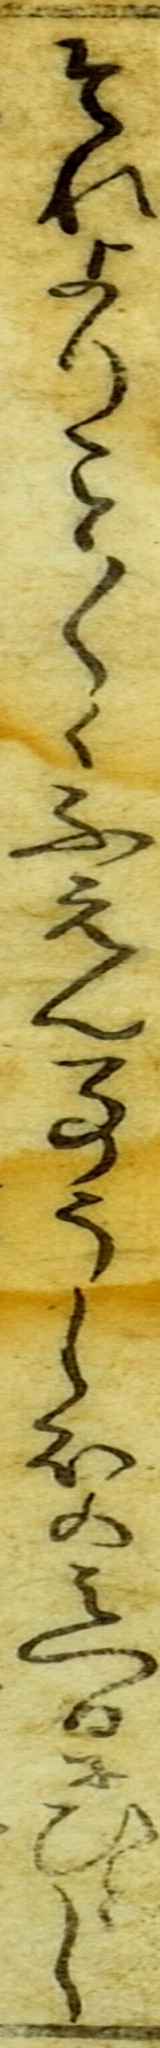それよりこと〳〵くふえん事うしほのみつるにひとし
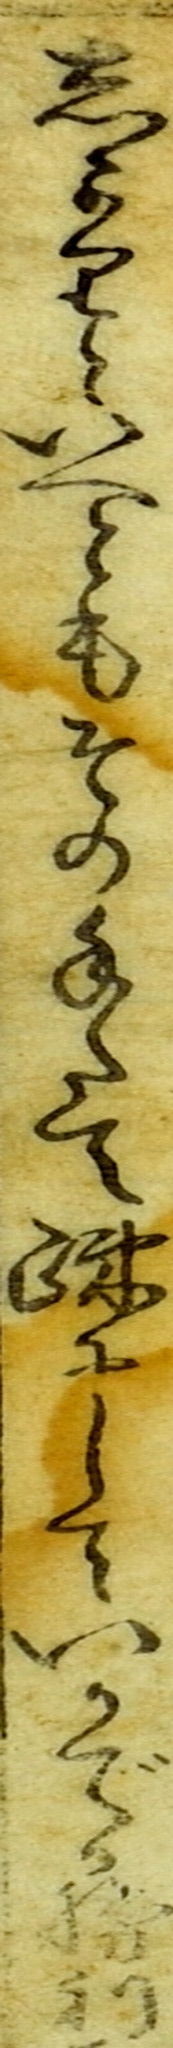しかりといえともその手たて疎にしていかでか勝利を

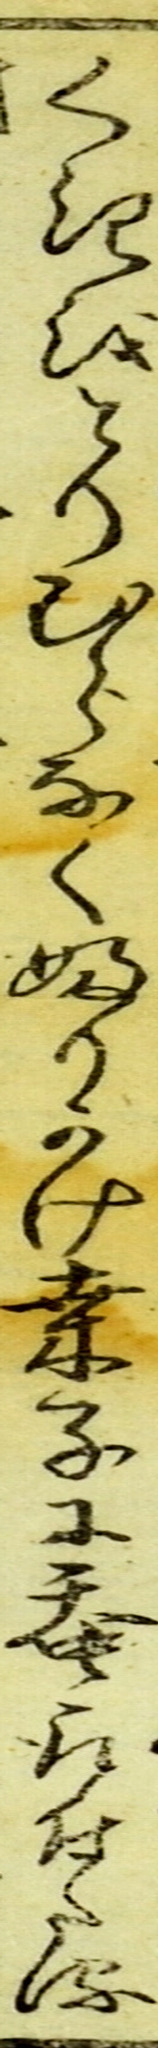くきをとりむらなくふりかけ桑子に蚕取付たる
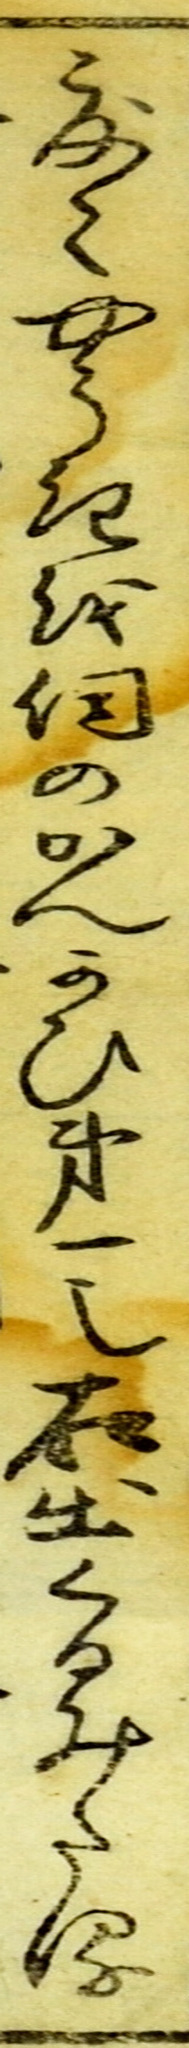度々やうきを伺のかんかひ第一也右出くるみたる
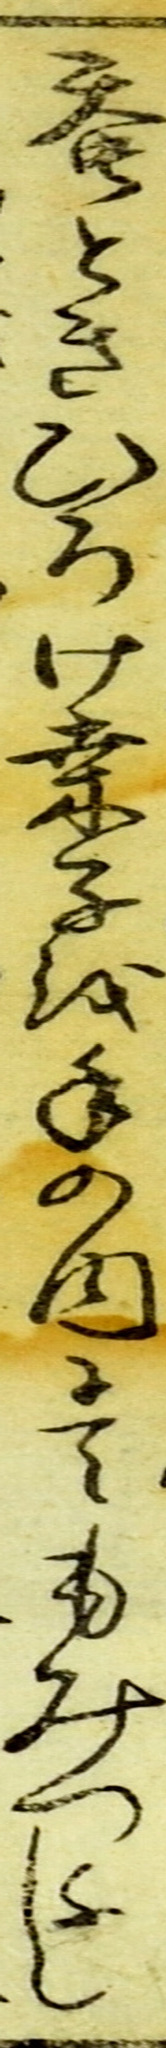蚕ときひろけ桑子を手の内にてもみつふし
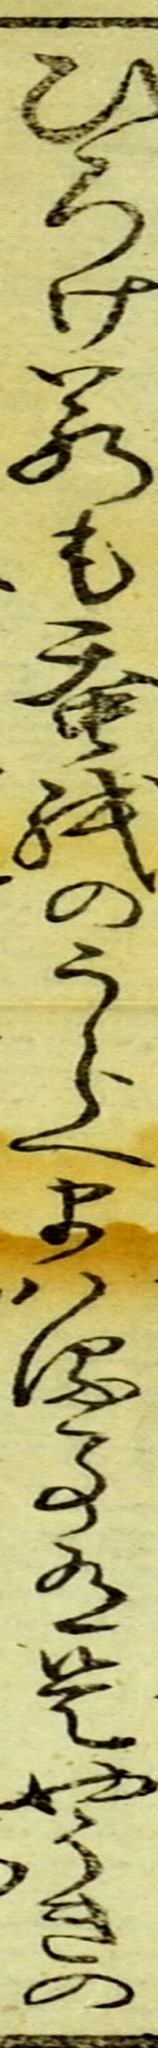ひろけ若も蚕紙のうらへまはる事有是やうきの
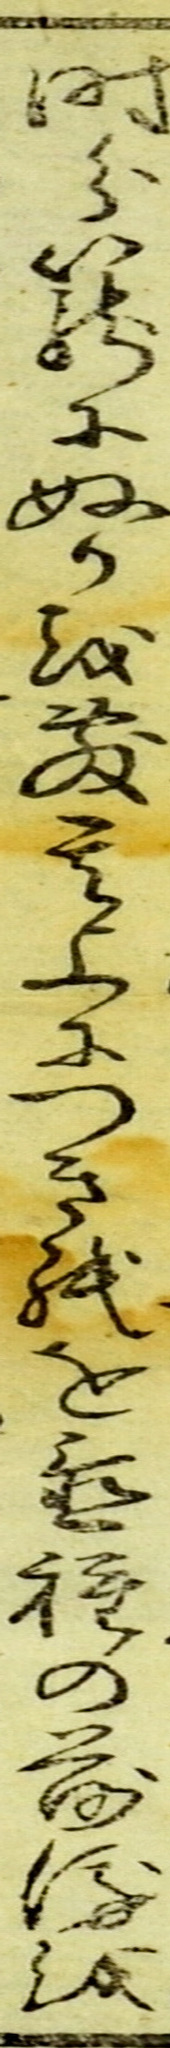時分籠にぬかを敷其上につき紙を置種の前後を
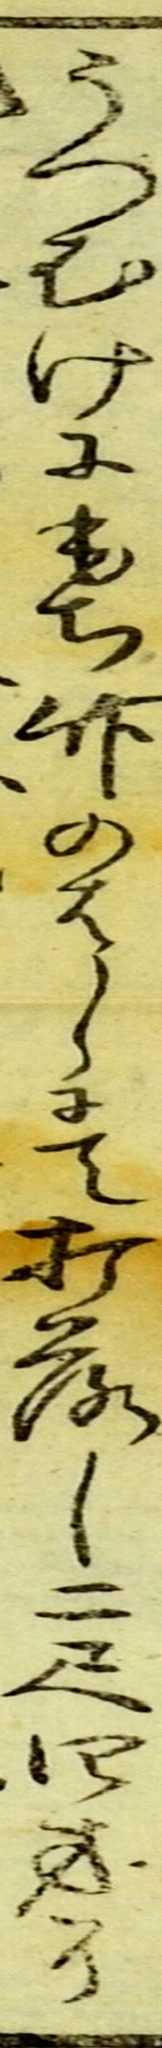うつむけにもち竹のはしにて打落し二尺四方に
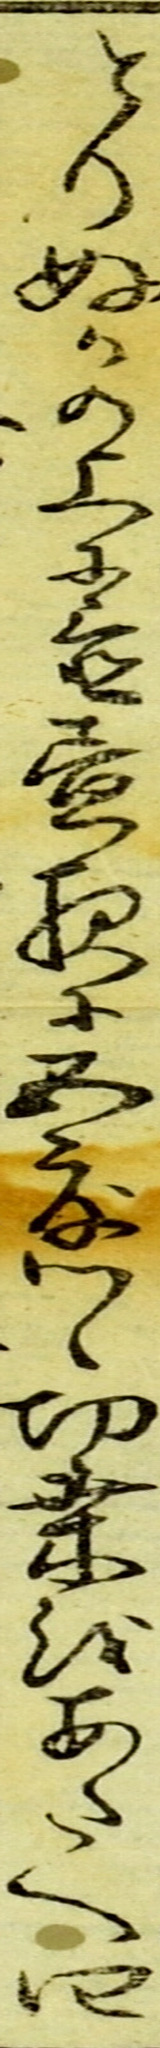とりぬかの上に置昼夜に五度ツヽ切桑をあたへ四
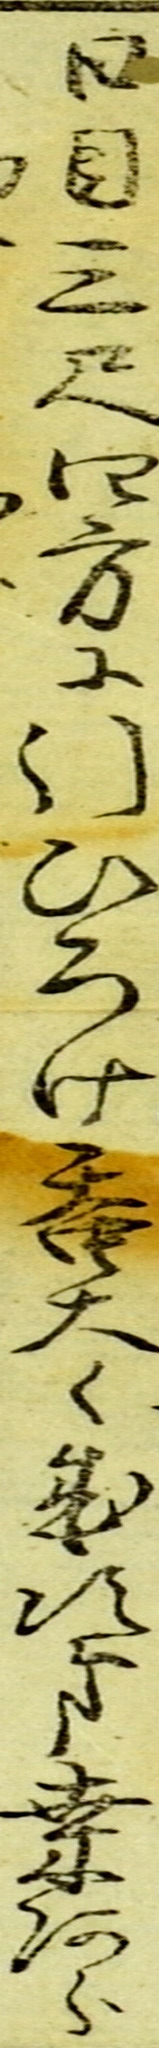日目三尺四方に引ひろけ蚕大く成次第桑あら
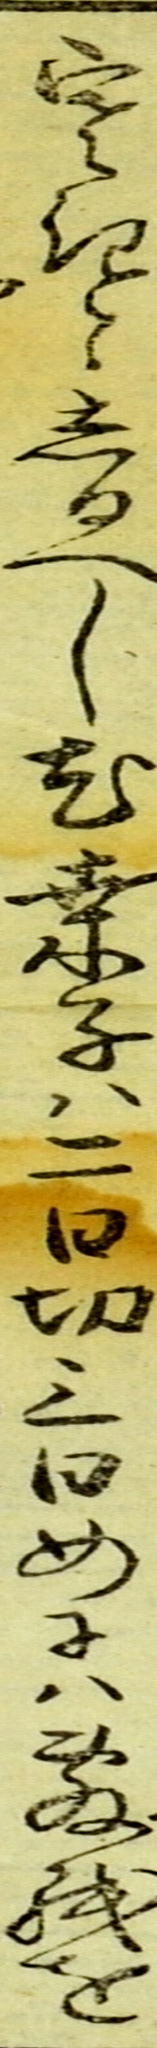寒きとしるへし尤桑子は二日切三日めには敷紙を
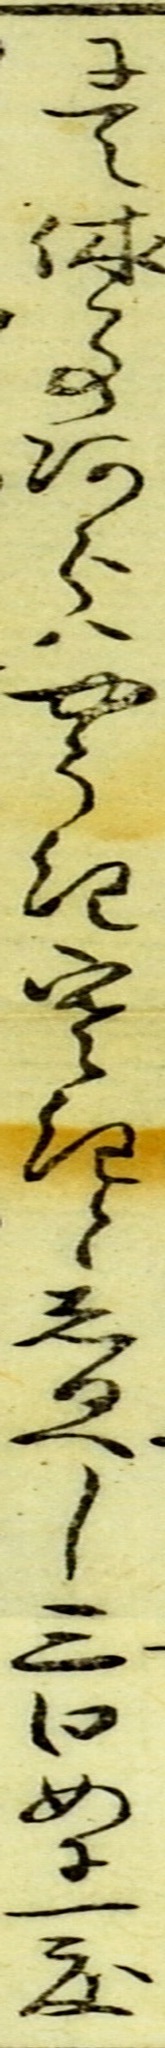にて休事あらはやうき寒きとしるへし三日めに一度
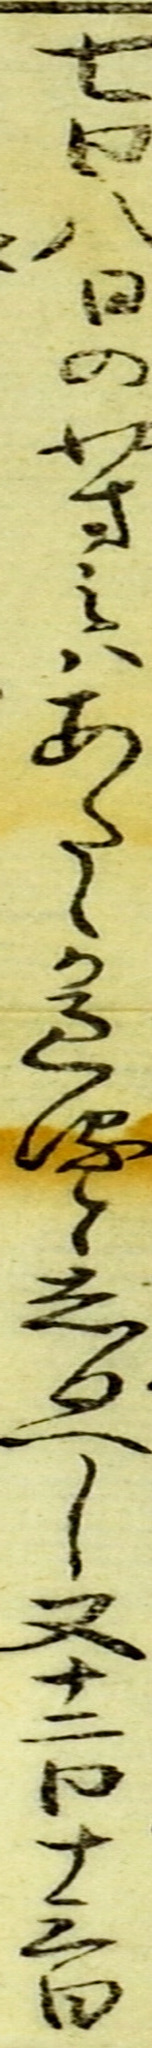七日八日のやすみはあたゝか過るとしるへし又十二日十三日
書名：覚
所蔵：伊那市立高遠町図書館・合同会社AMANE
